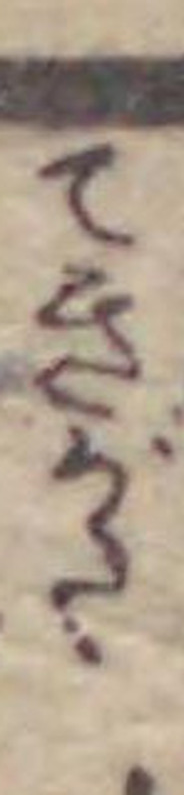てきがた
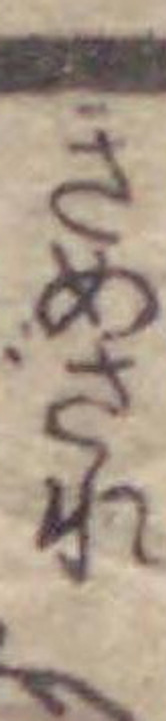きめされ
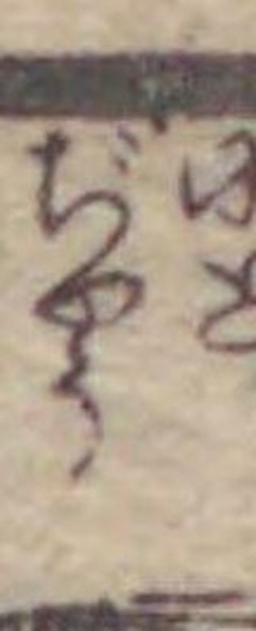じやう
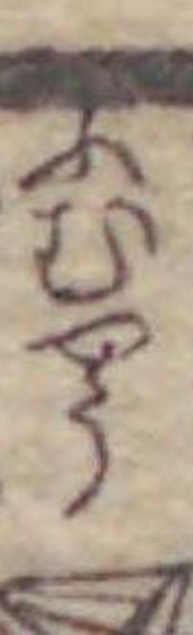ふむやう
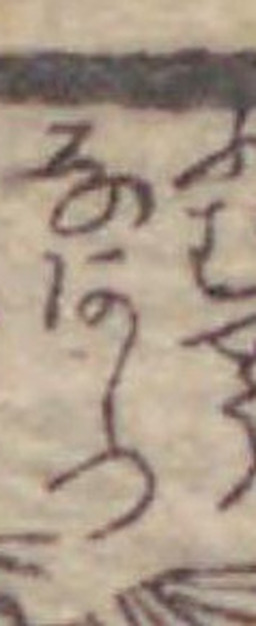なあしつ
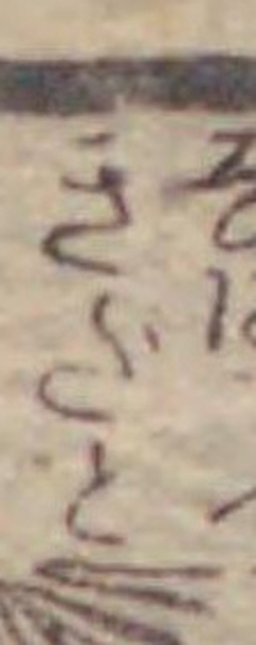きだと
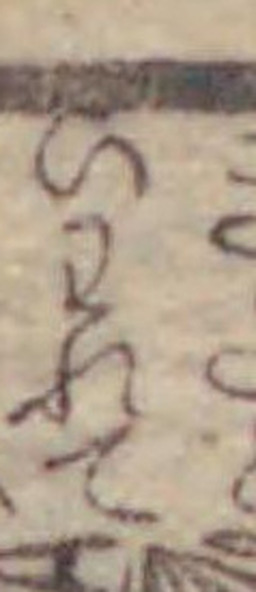いわれて
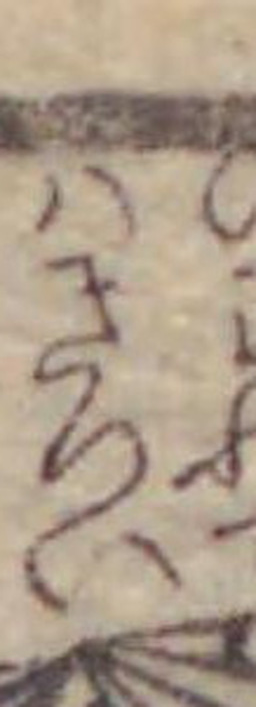はきつい
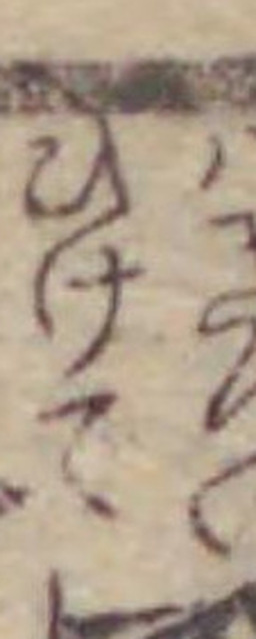ひけて
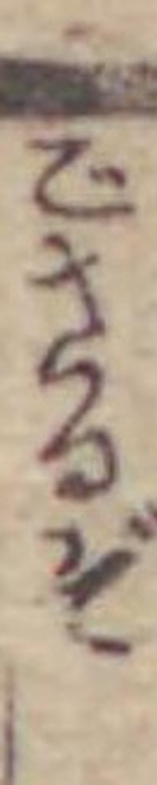ごさるぞ
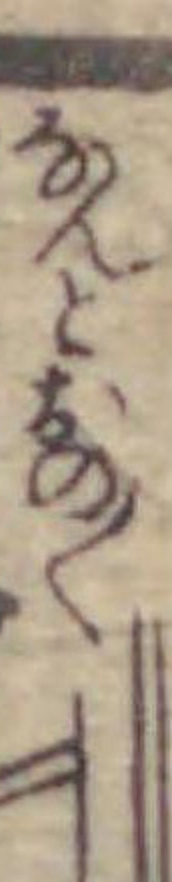なんとおの〳〵
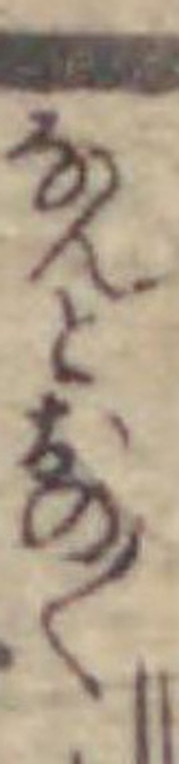なんとおの〳〵
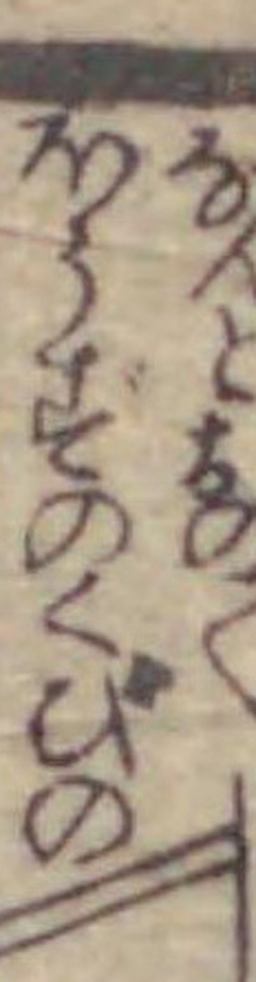ほうずのくびの
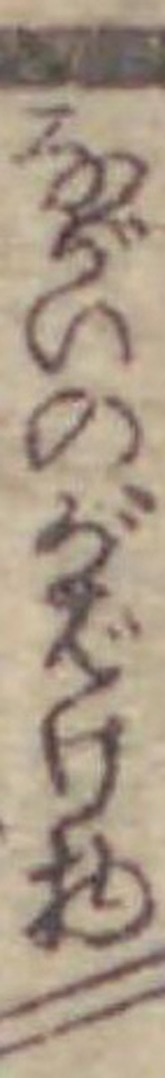ながいのがばけ物
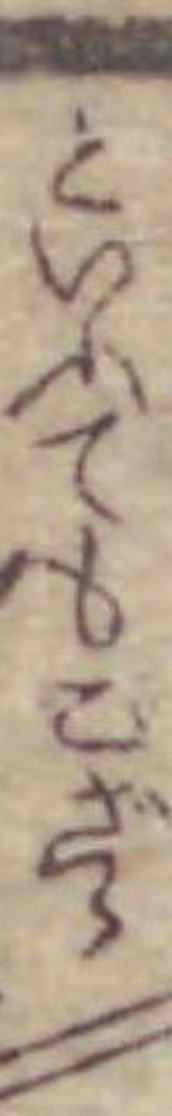といふてもこざら
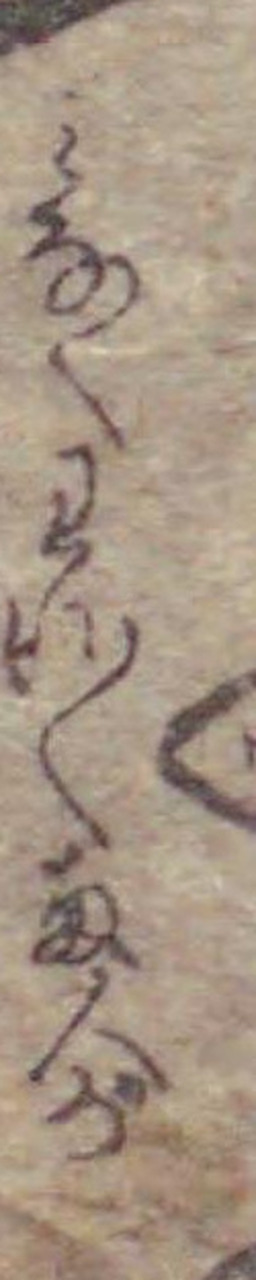みな〳〵われ〳〵両人が
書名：化物仲間破 : 2巻
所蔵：国立国会図書館 National Diet Library, JAPAN
